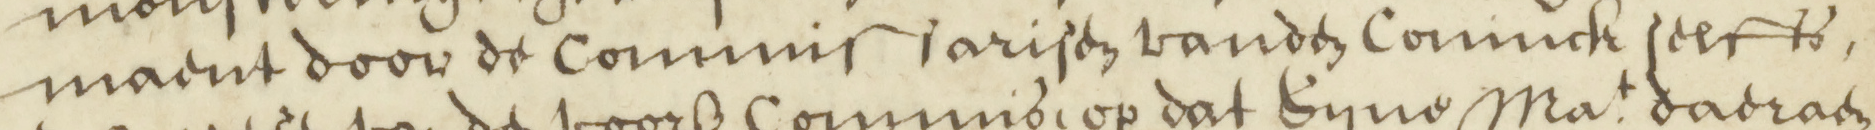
maent door de Commissarisen vanden Coninck selffs,
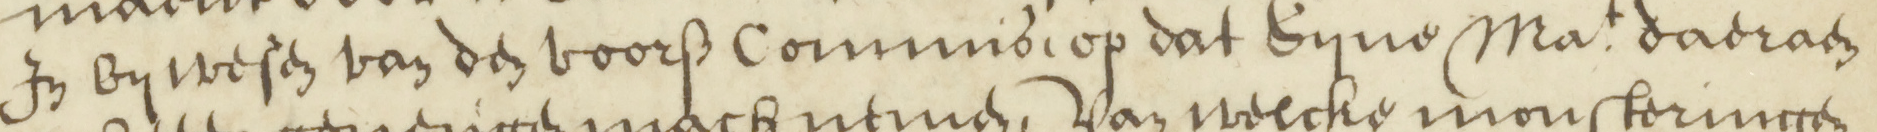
in by wesen van den voors Commis, op dat Syne Mat. daeraen
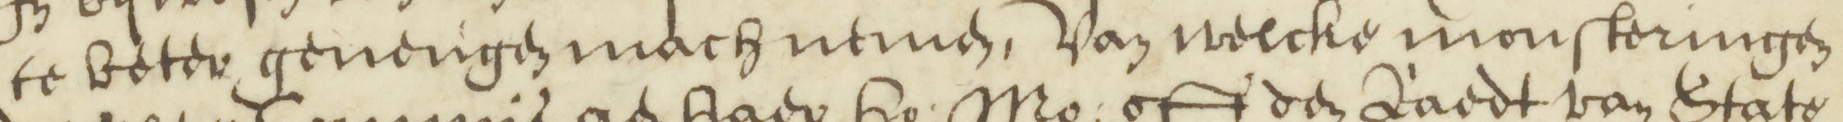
te beter geneugen mach nemen. Van welcke monsteringen
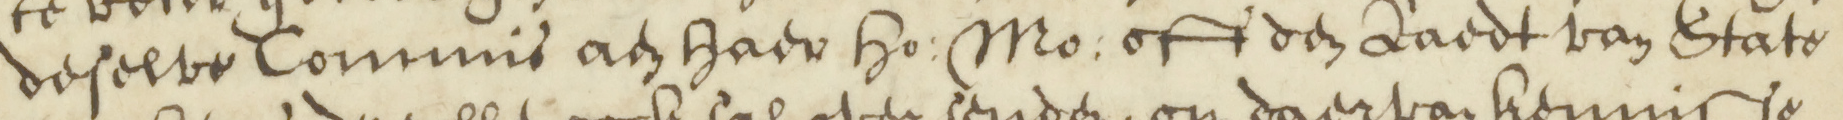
deselve Commis an haer ho:Mo: off den Raedt van State
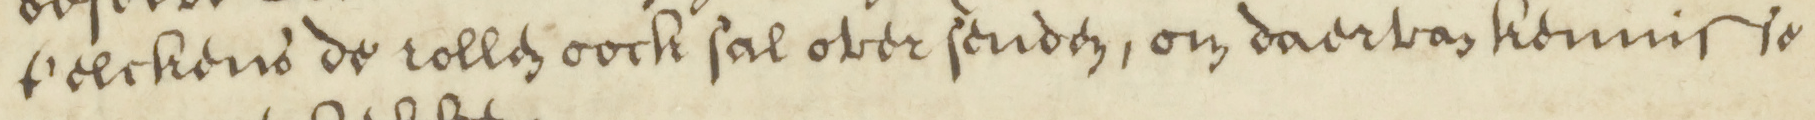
t‛elckens de rollen oock sal oversenden, om daervan kennisse
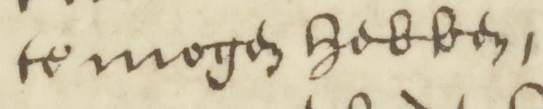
te mogen hebben.
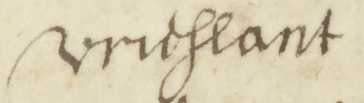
vrieslant
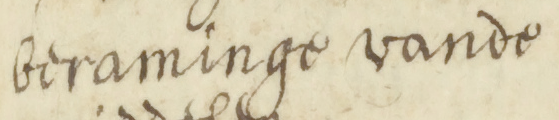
beraminge vande
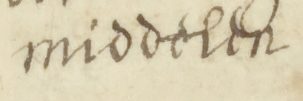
middelen
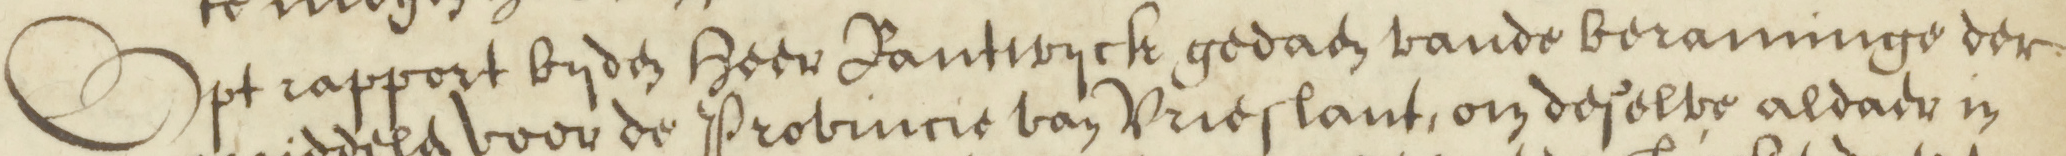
Opt rapport by den heer Rantwyck gedaen vande beraminge der
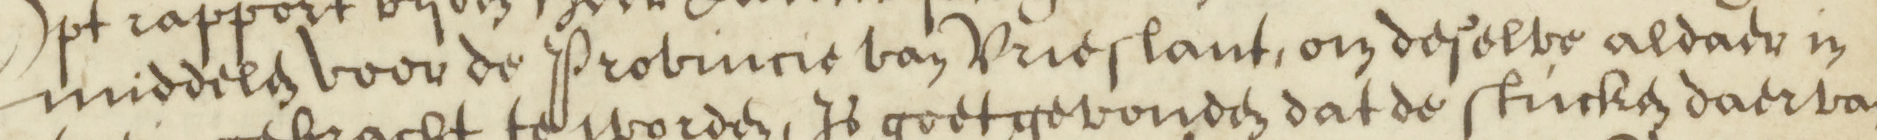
middelen voor de Provincie van Vrieslant, om deselve aldaer in
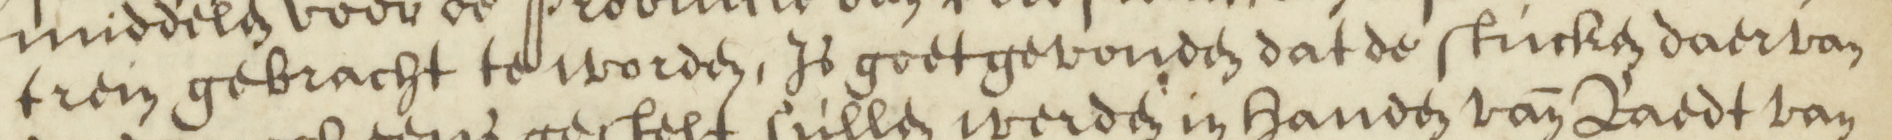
trein gebracht te worden, Is goetgevonden dat de stucken daervan
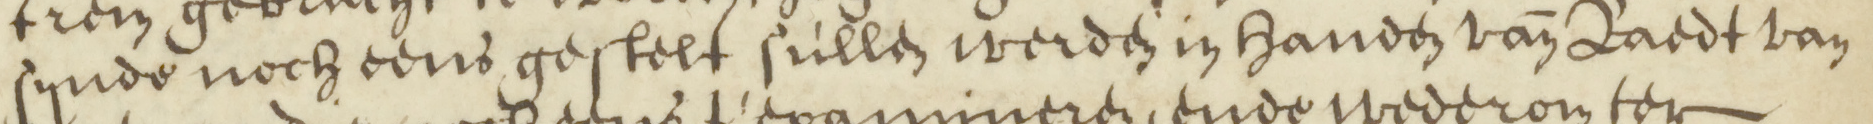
synde noch eens gestelt sullen werden in handen van Raedt van
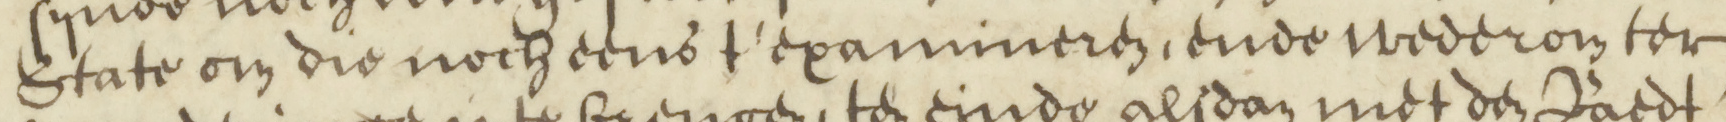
State om die noch eens t'examineren, ende wederom ter
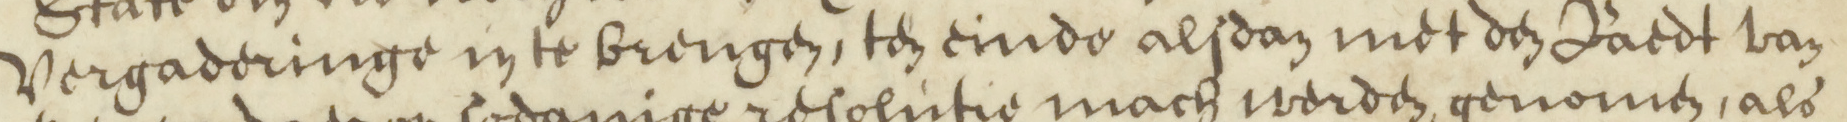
Vergaderinge in te brengen, ten einde alsdan met den Raedt van
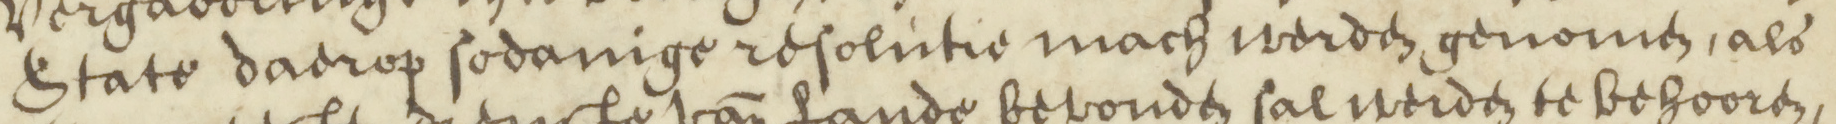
State daerop sodanige resolutie mach werden genomen, als
